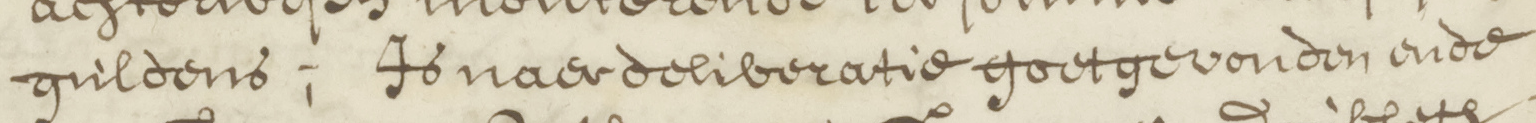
guldens; Is naer deliberatie goetgevonden ende
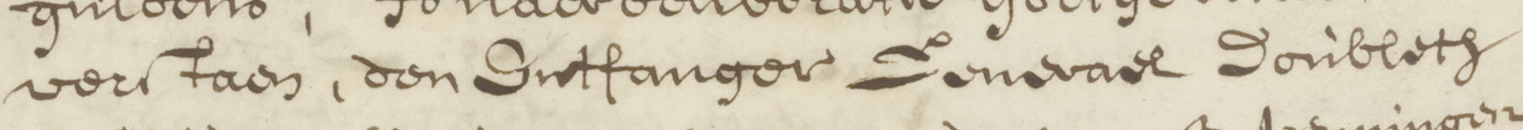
verstaen, den Ontfanger Generael Doubleth
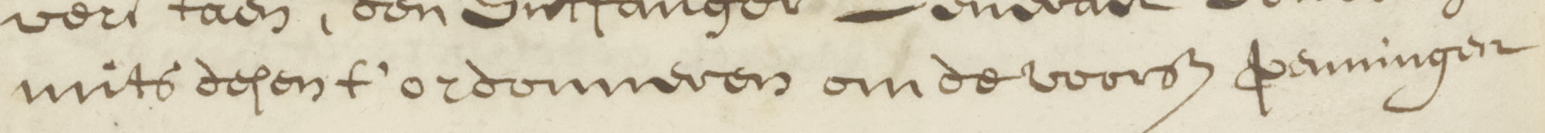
mits desen t'ordonneren om de voors penningen
